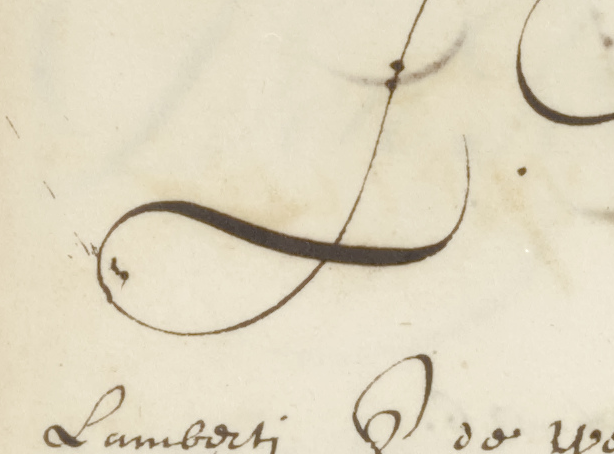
L.
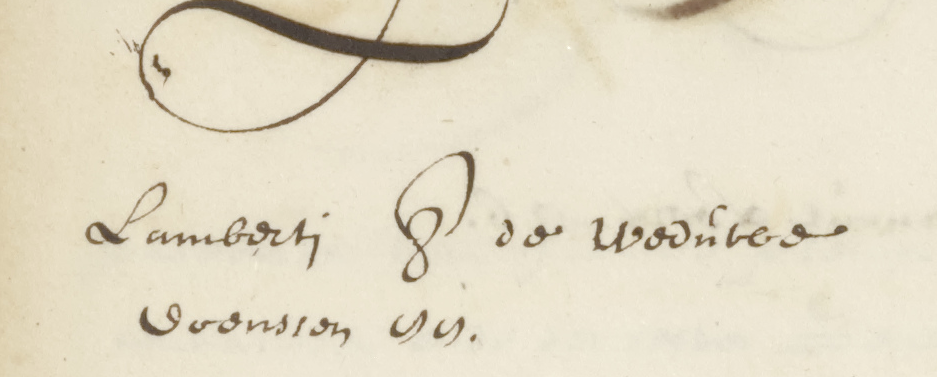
Lamberti Ca. de Weduwe
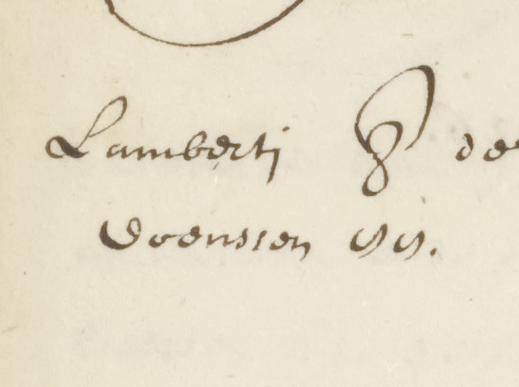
Doenssen 88.
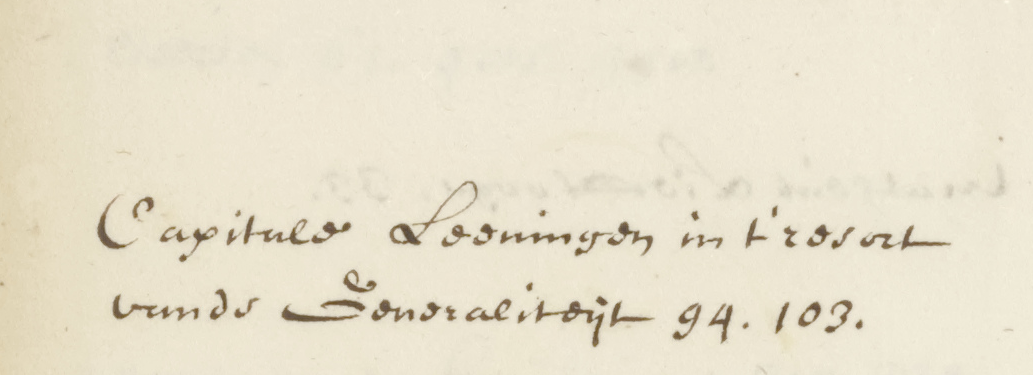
Capitale Leeningen in t‛resort
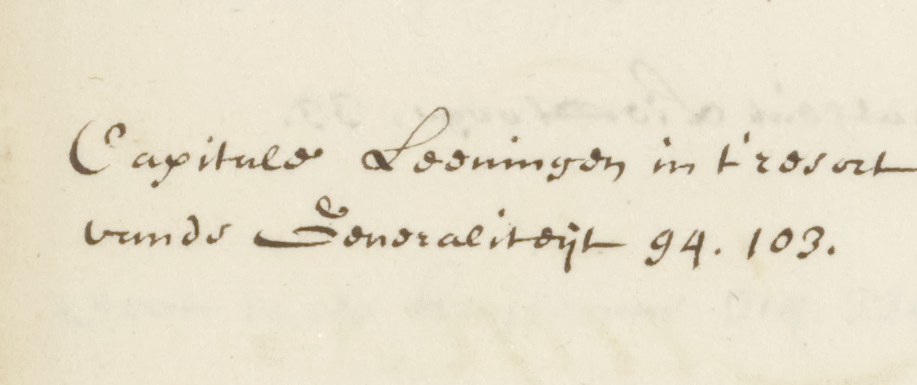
vande Generaliteijt 94. 103.
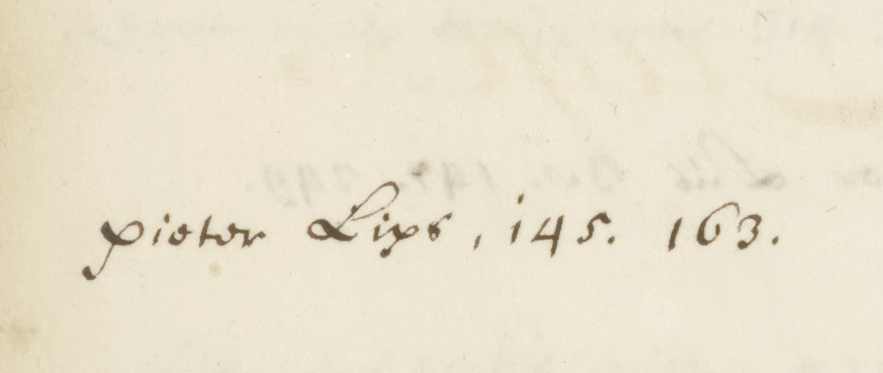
Pieter Lips, 145. 163.
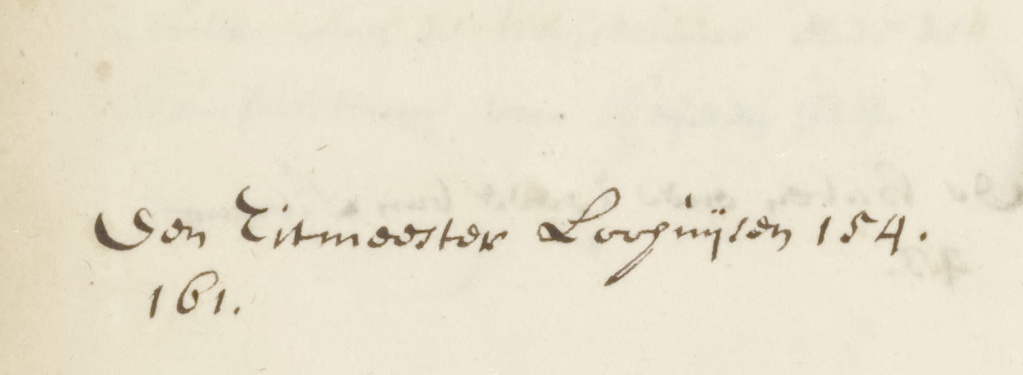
Den Ritmeester Loohuijsen 154.
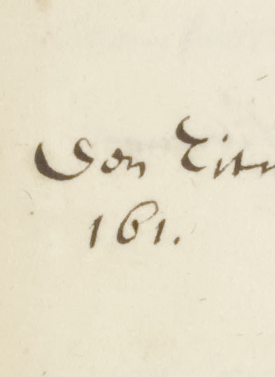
161.
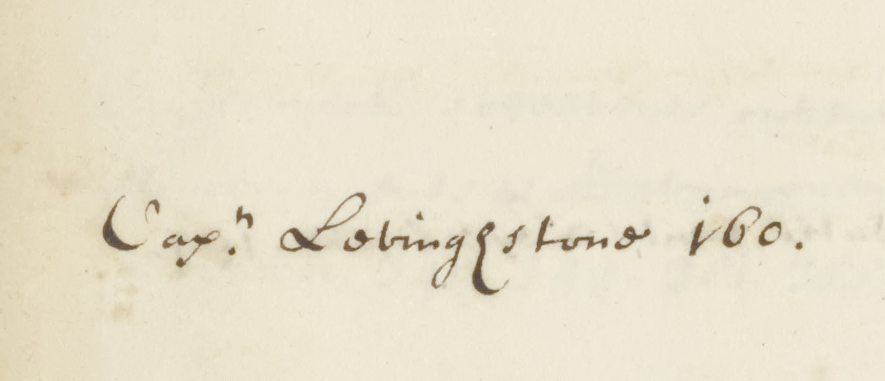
Capn. Levinghstone 160.
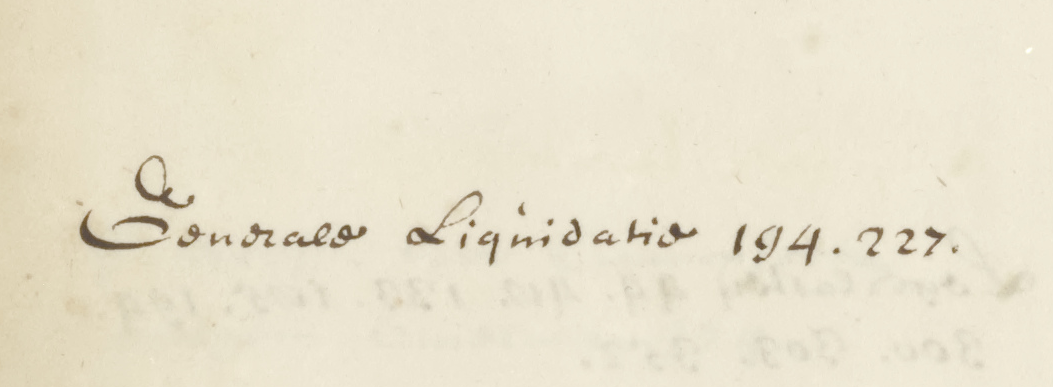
Generale Liquidatie 194. 227.
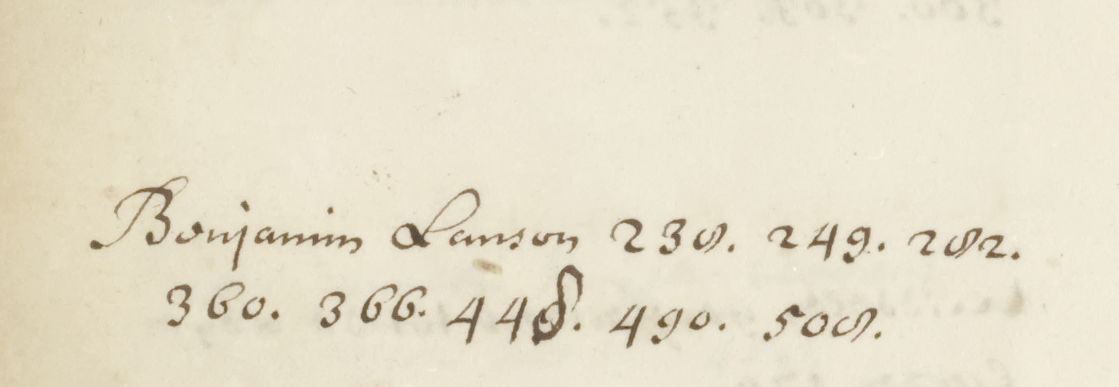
Benjamin Lansen 238. 249. 282.
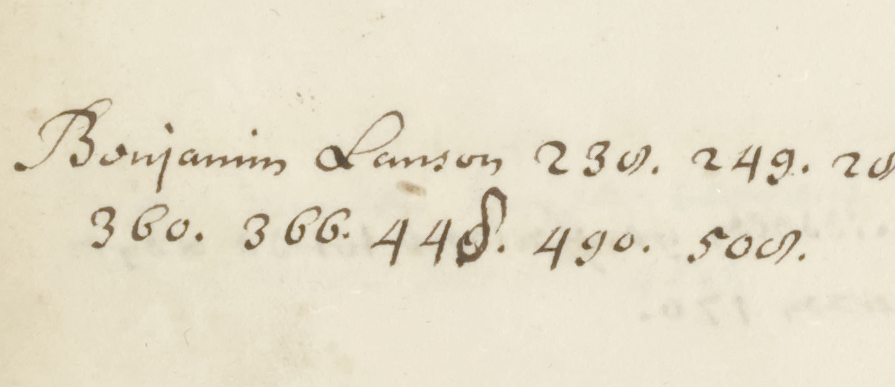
360. 366. 448. 490. 508.
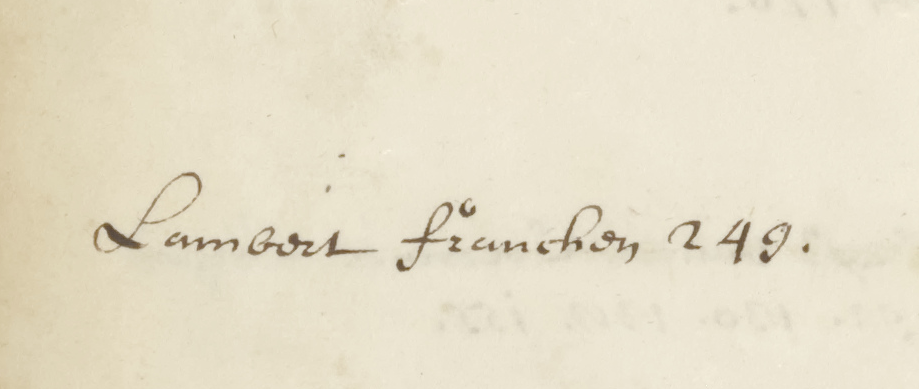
Lambert Francken 249.
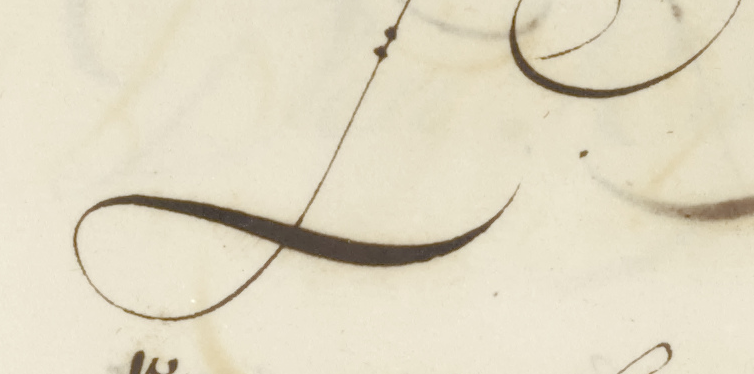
L.
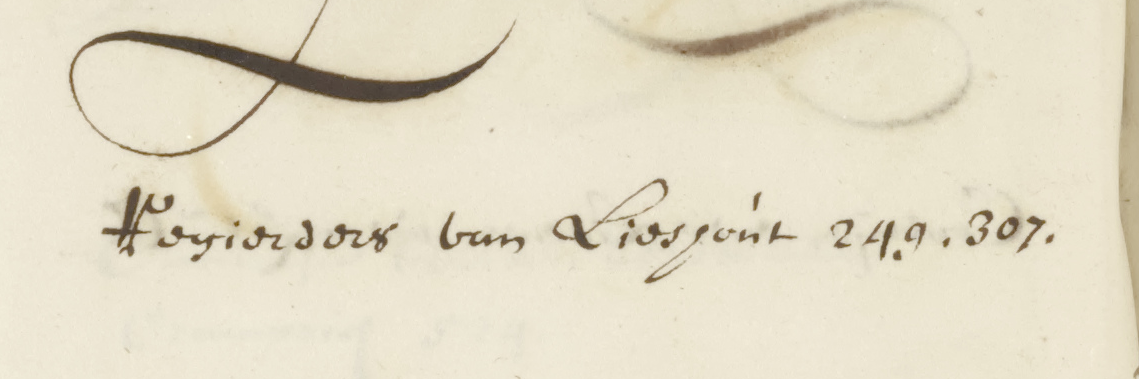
Regierders van Lieshout 249. 307.
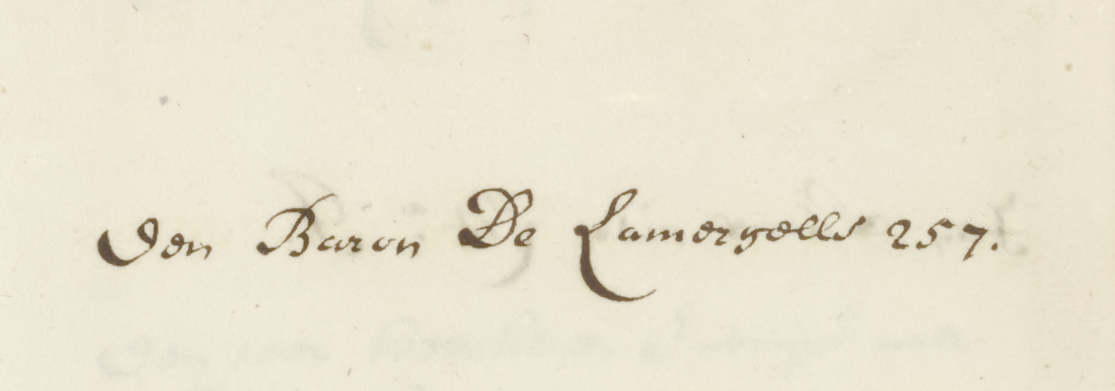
Den Baron De Lamergells 257.
